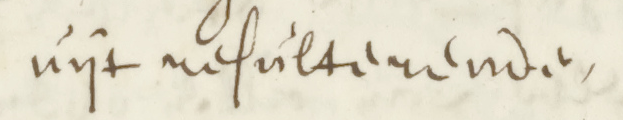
uijt resulterende.
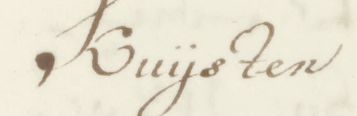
Kuijsten
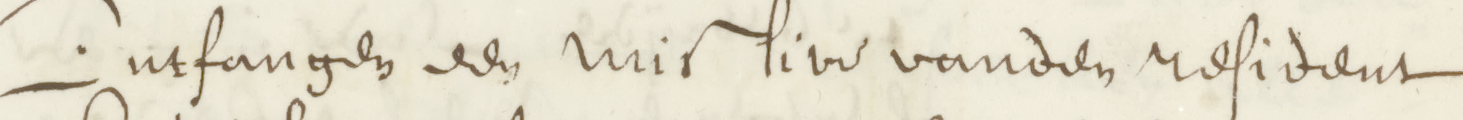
Ontfangen een missive vanden resident
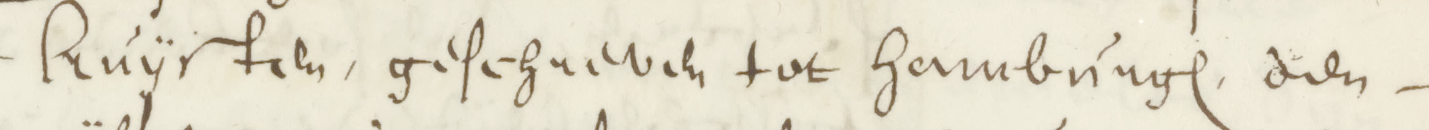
Kuijsten, geschreven tot hamburgh, den
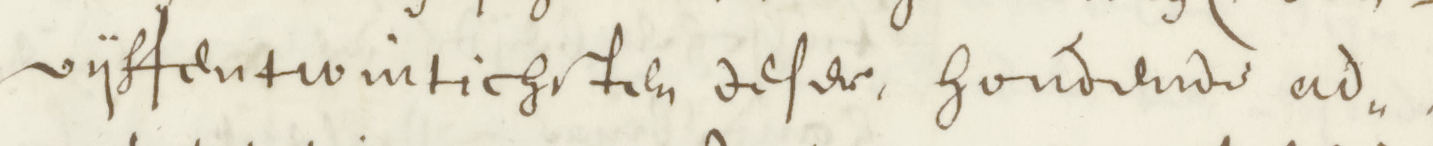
vijffentwintichsten deser, houdende ad„
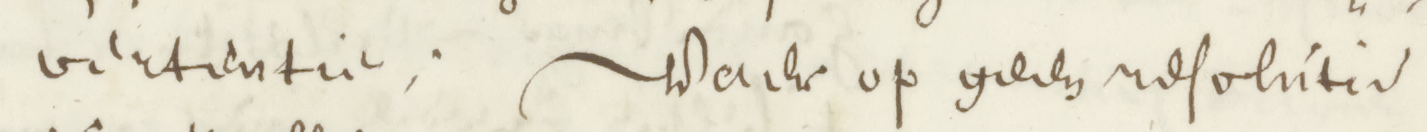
vertentie; Waer op geen resolutie
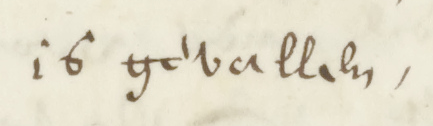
is gevallen.
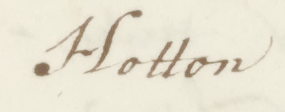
Hotton
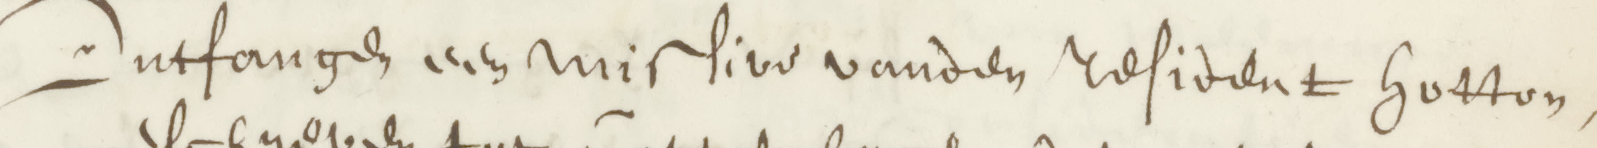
Ontfangen een missive vanden resident hotton
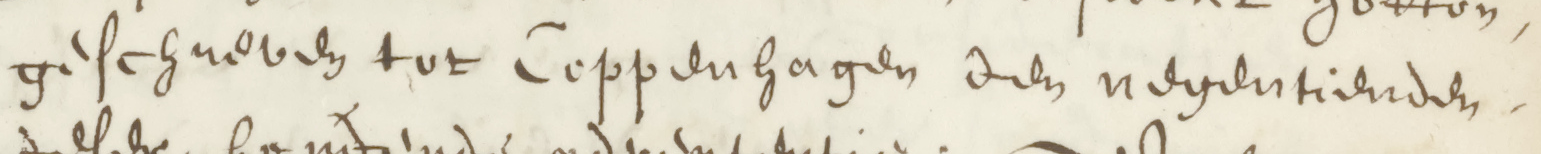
geschreven tot Coppenhagen den negentienden
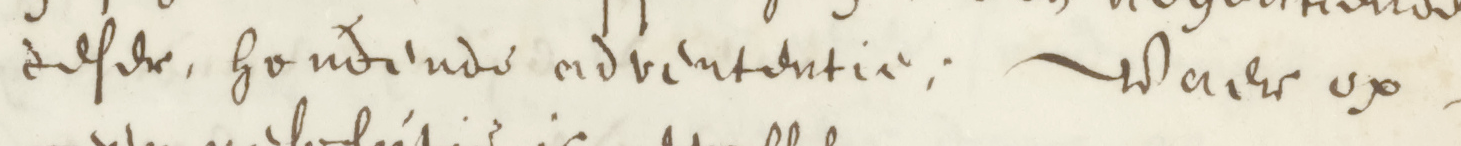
deser, houdende advertentie; Waer op
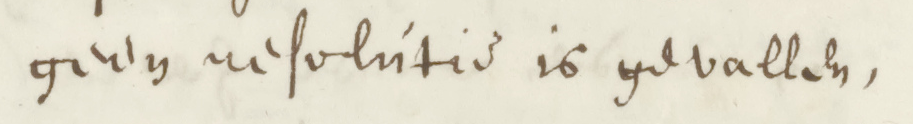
geen resolutie is gevallen.
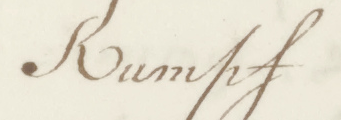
Rumpf
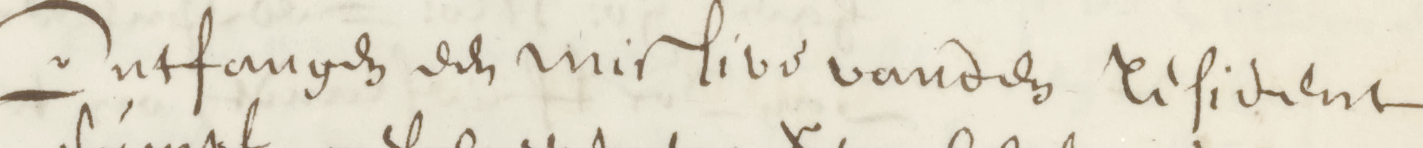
Ontfangen een missive vanden resident
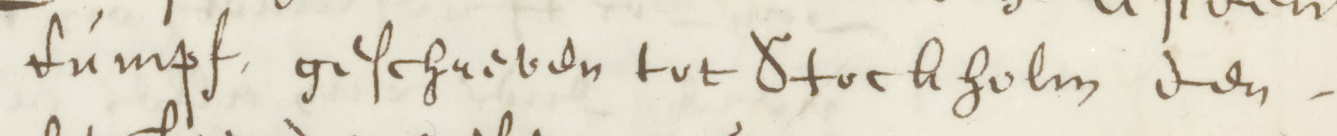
Rumpf, geschreven tot Stockholm den
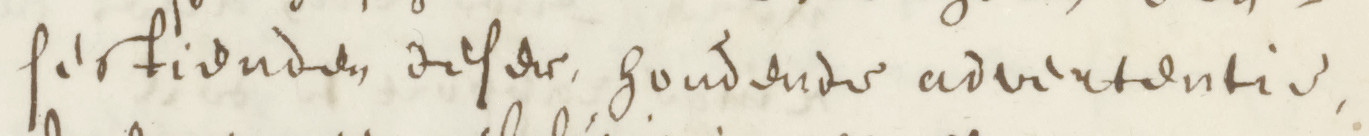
sestienden deser, houdende advertentie,
